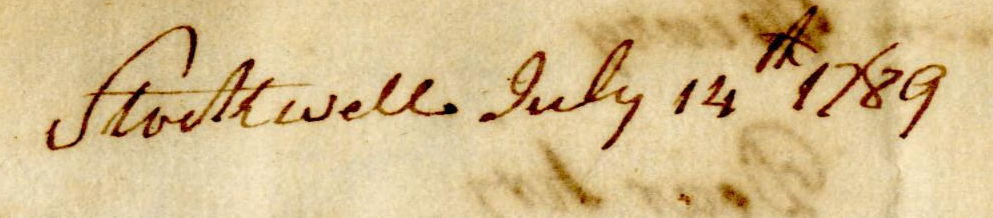Stockwell July 14^th 1789
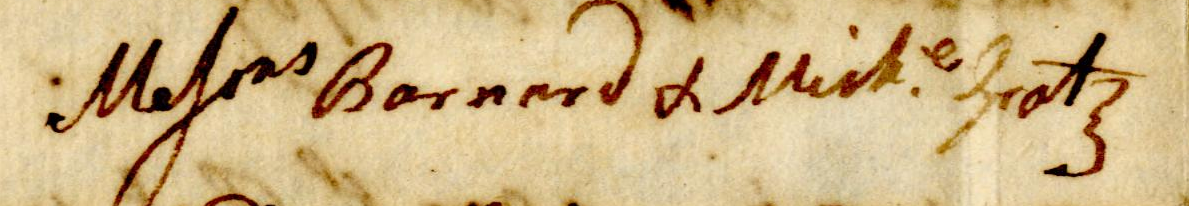Mess^rs Barnard & Mich^l Gratz
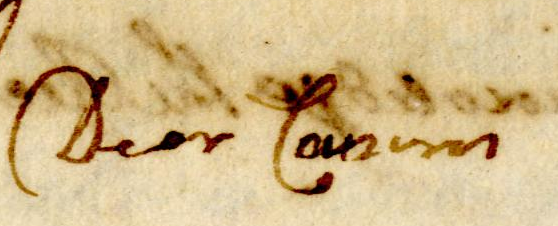Dear Cousins
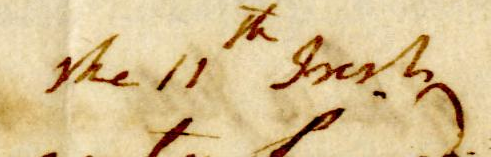the 11^th Inst.
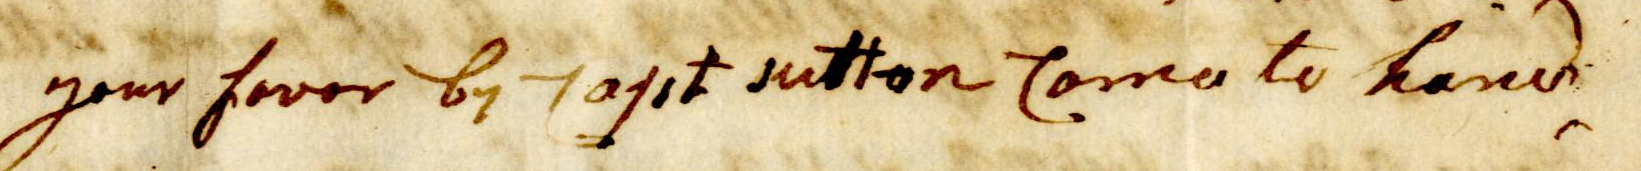your favor by Capt Sutton Came to hand
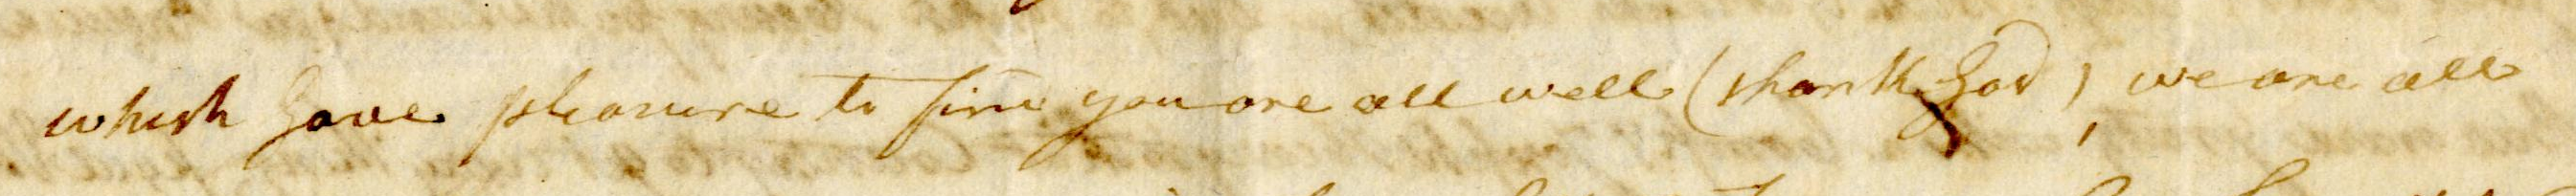which gave pleasure to find you are all well (thank God) we are all
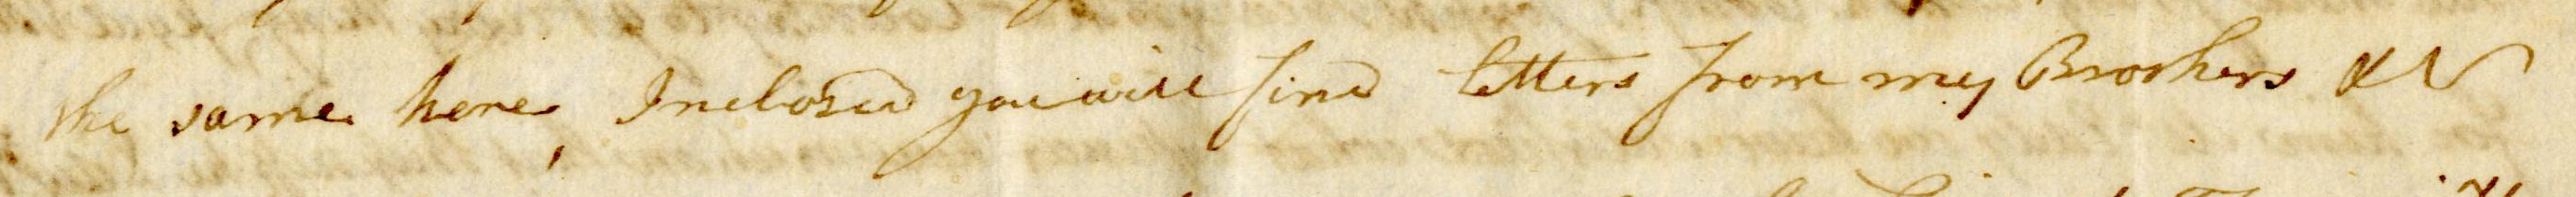the same here Inclosed you will find letters from my Brothers &c
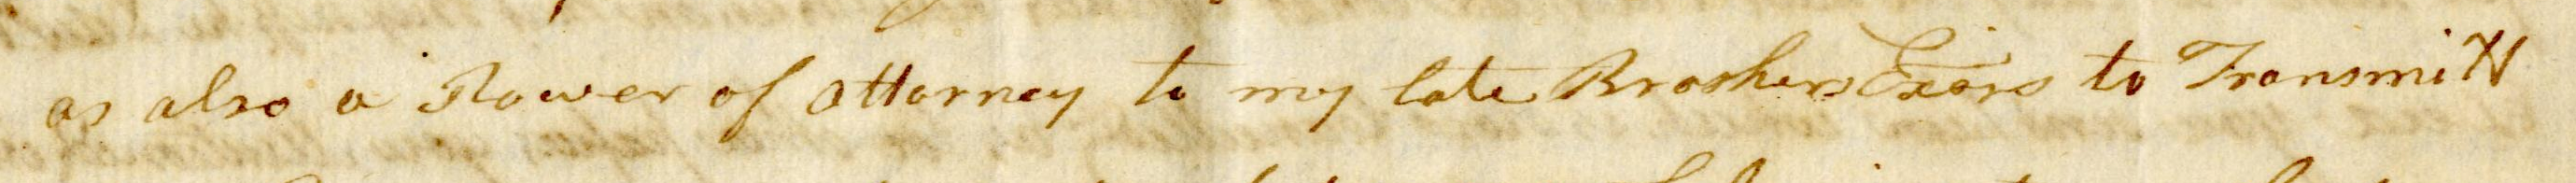as also a Power of Attorney to my late Brothers Exers to Transmitt
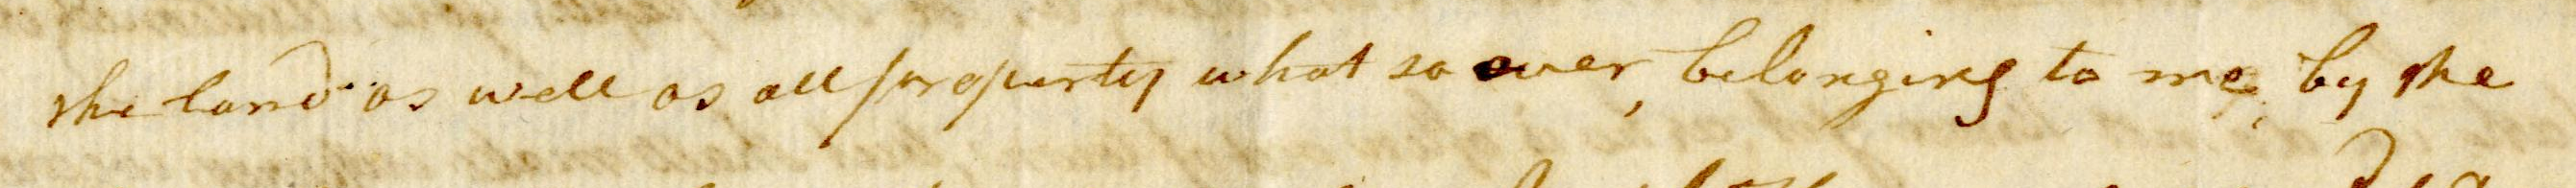the land as well as all property what soever, belonging to me, by the
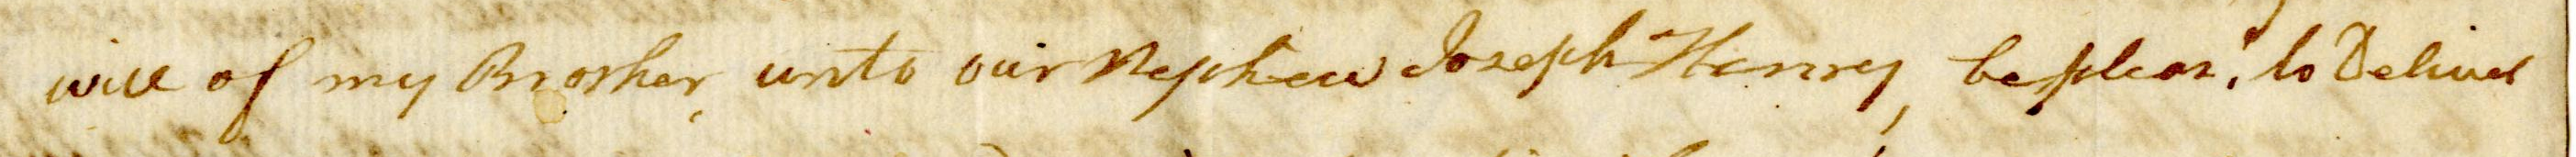will of my Brother unto our nephew Joseph Henry, be pleas^d to Deliver
